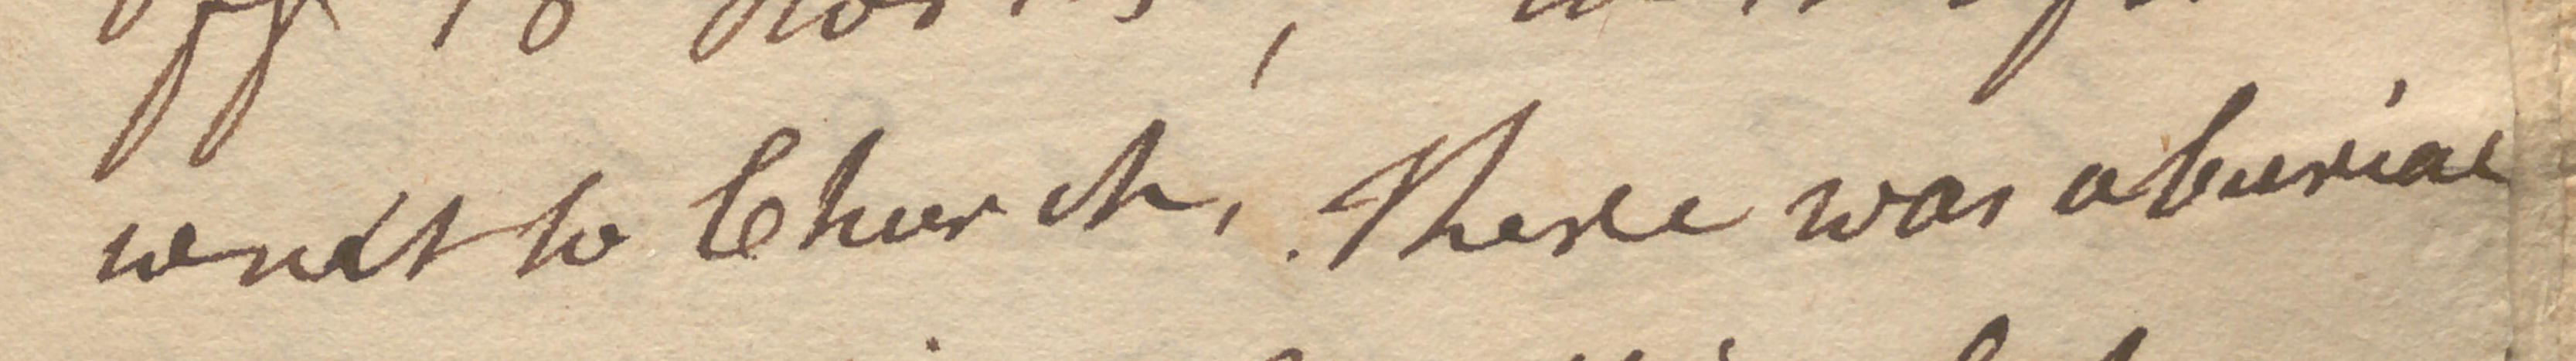wnt to Church, there was a burial
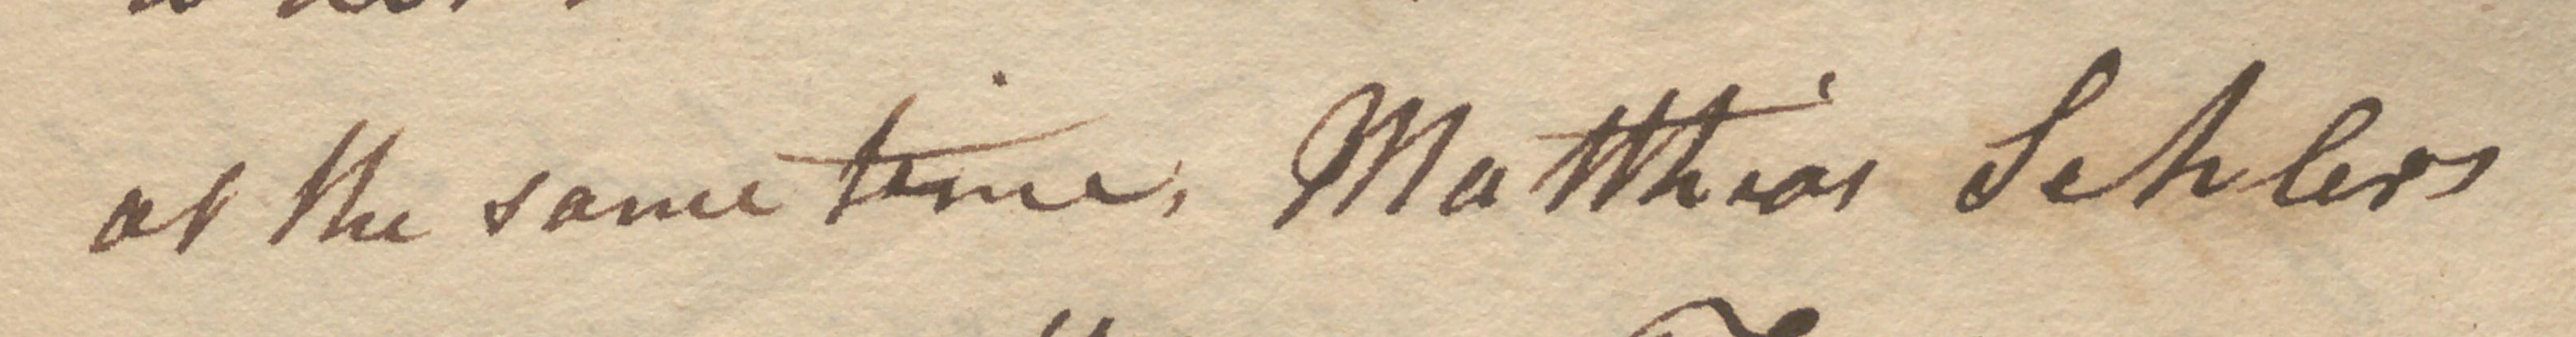at the same time, Matthias Seklers
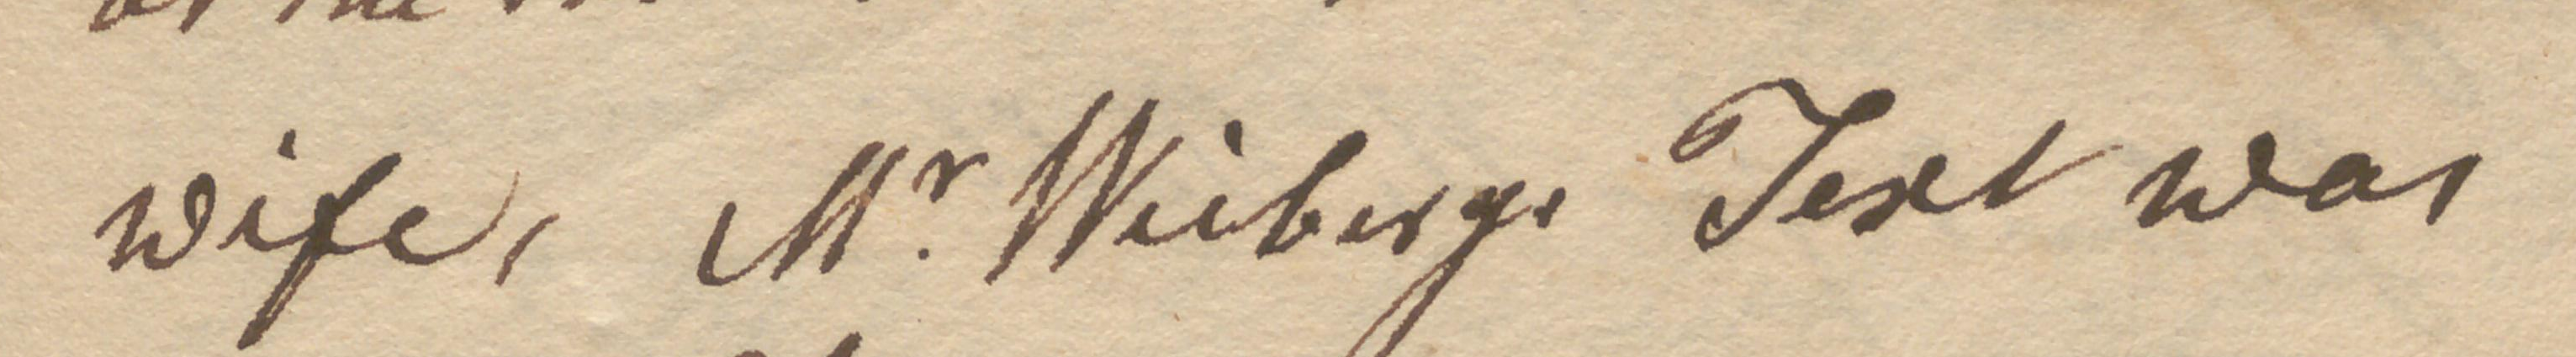wife, M^r. Weibergs Text was
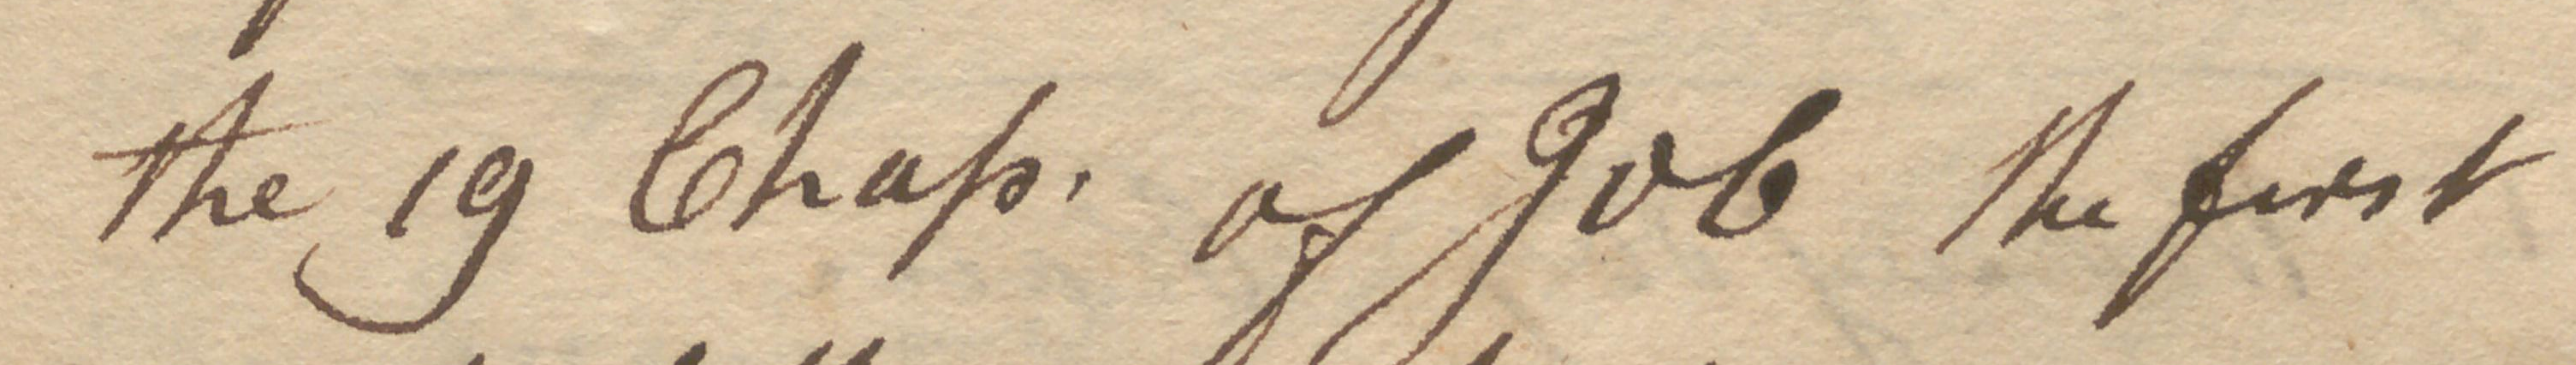the 19 Chap. of Job the first
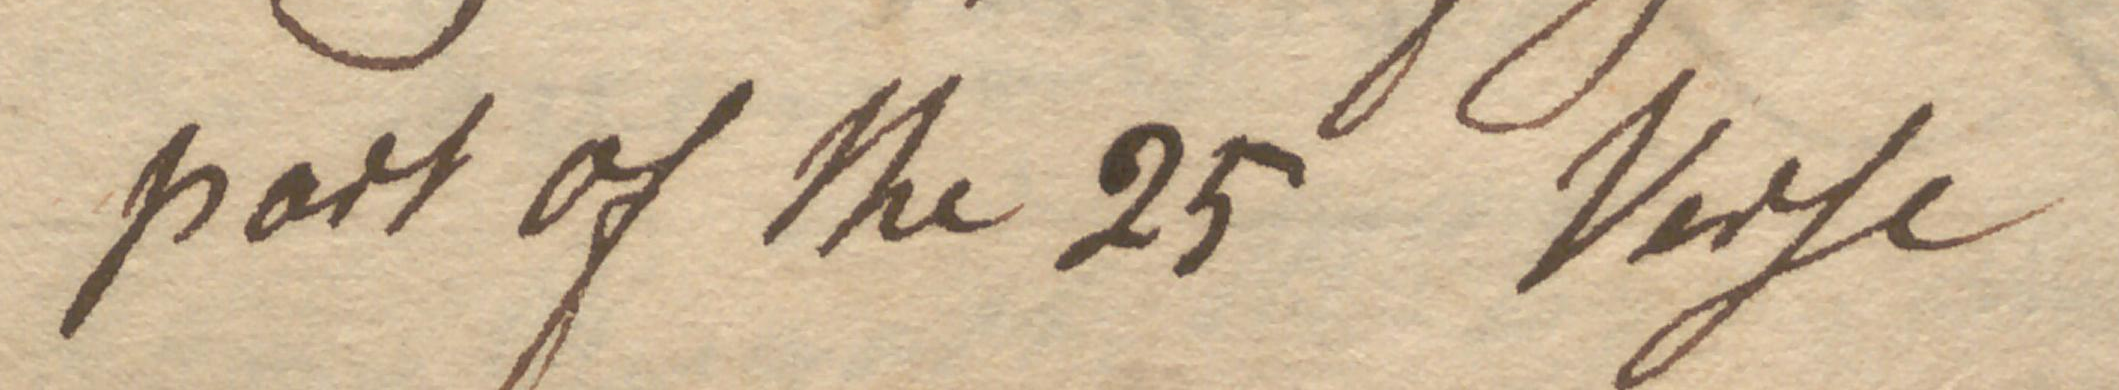part of the 25 Verse
